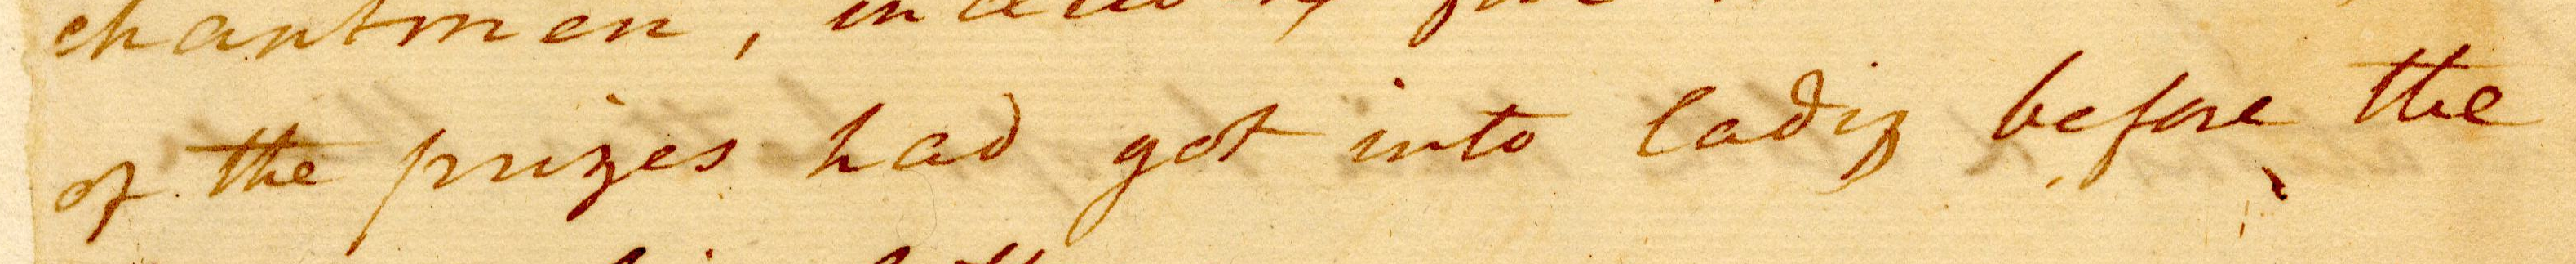of the prizes had got into Cadiz before the
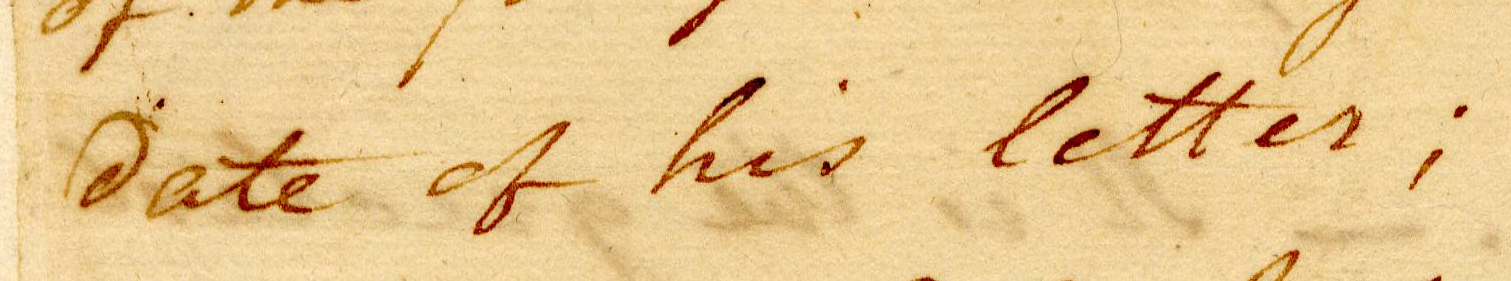date of his letter;
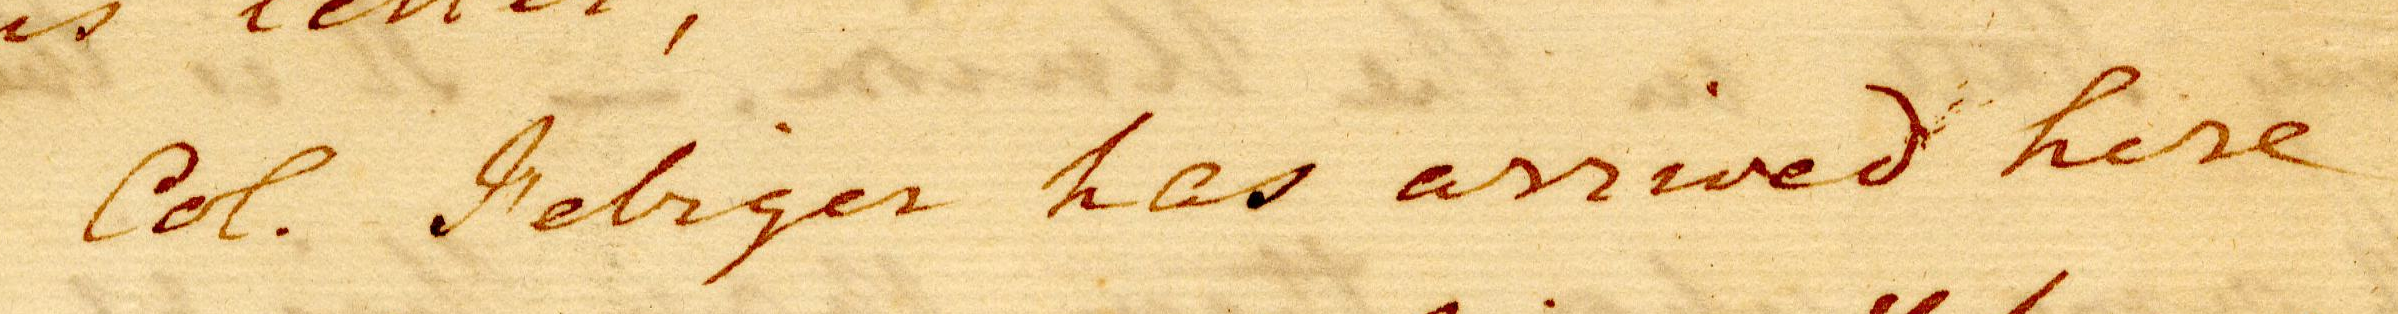Col. Febiger has arrived here
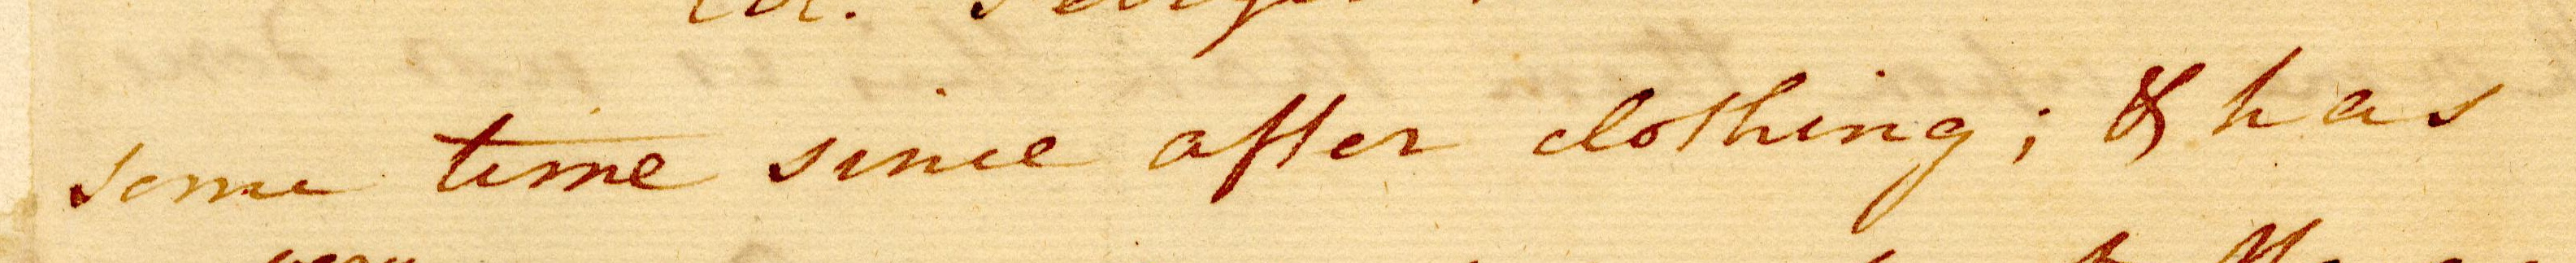some time since after clothing; & has
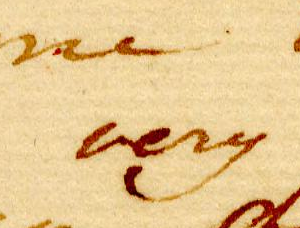very
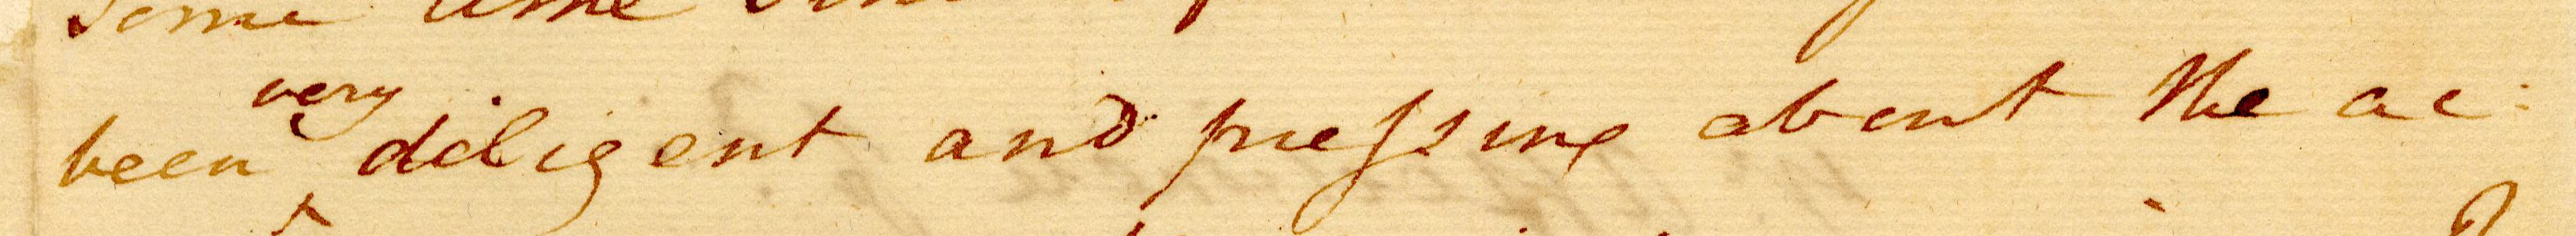been ^ diligent and pressing about the ac-
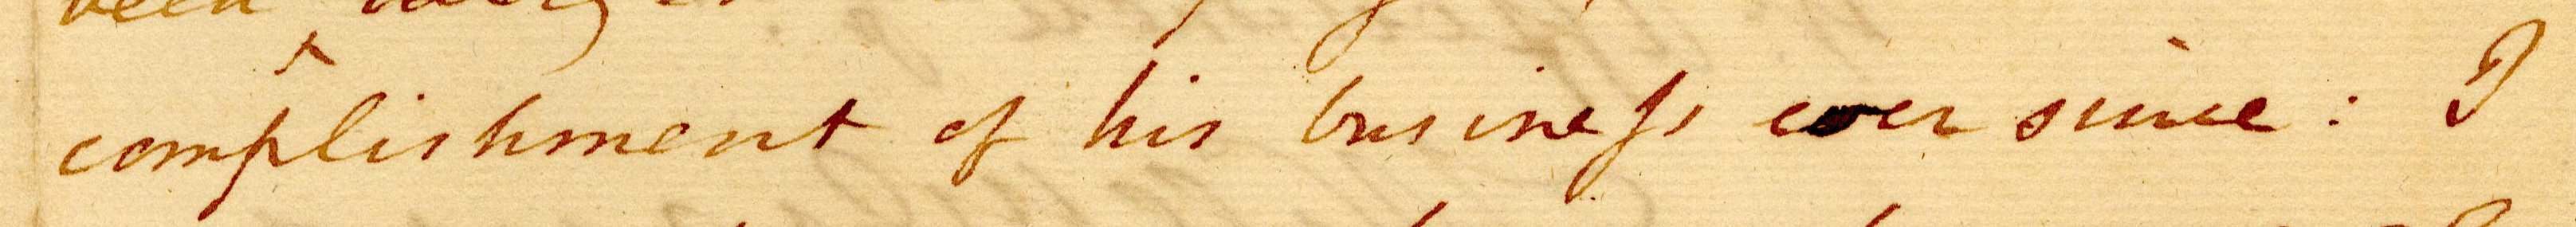complishment of his business ever since: I
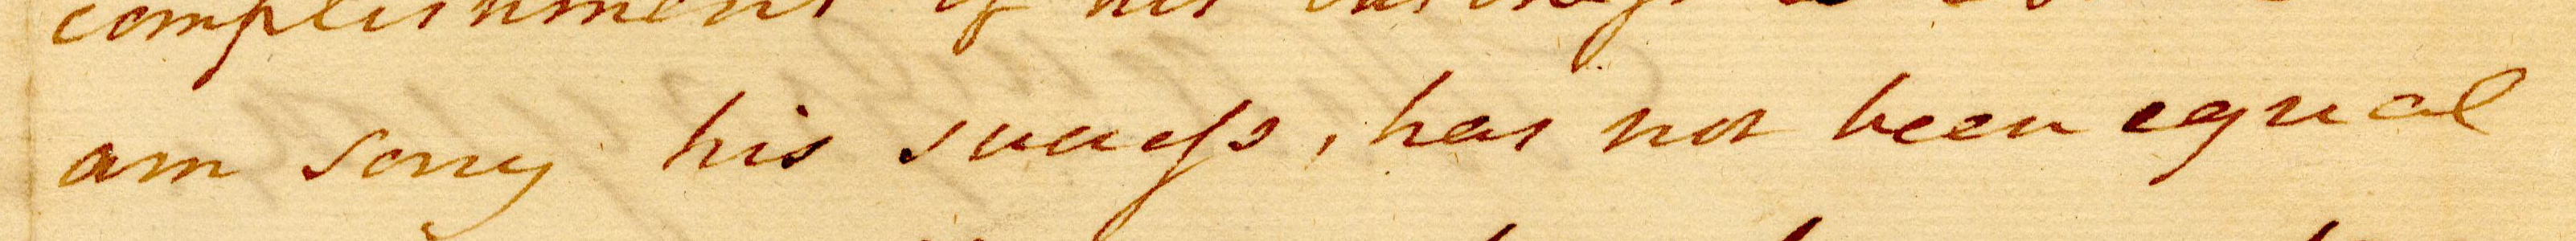am sorry his success, has not been equal
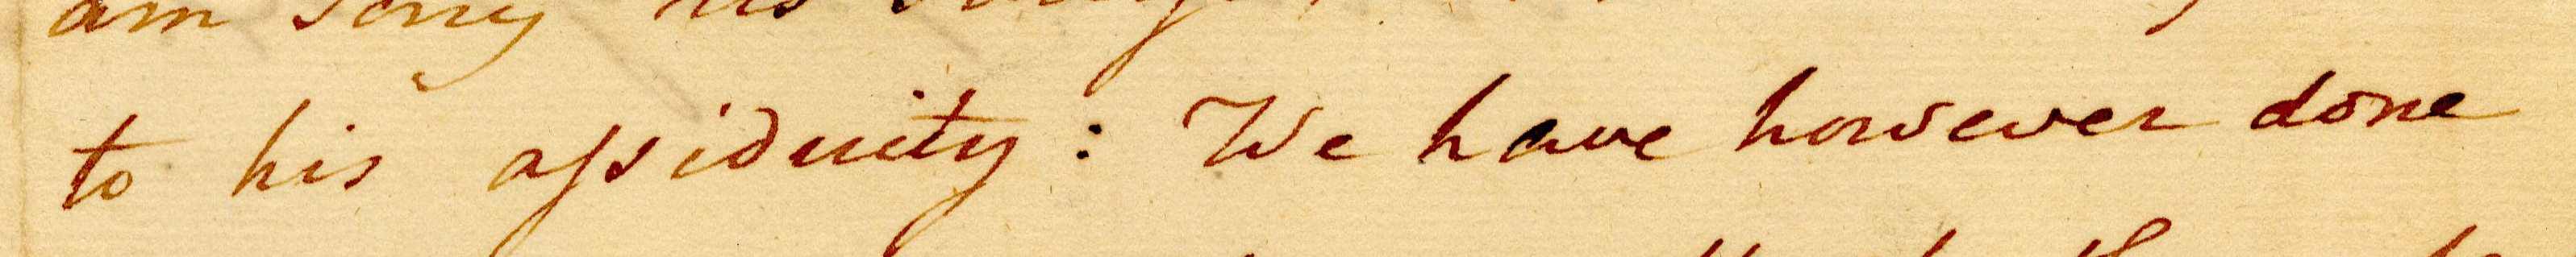to his assiduity: We have however done
